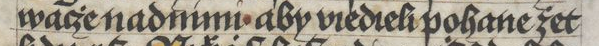wacže nadnimi.aby viedieli pohane żet
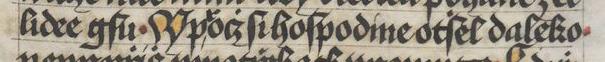lidee gſu.Y procż ſi hoſpodine otẛel daleko
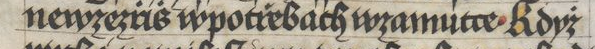newzezṙiṡ wpotṙebach wzamutce.Kdyż
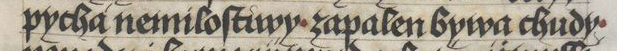pychá nemiloſtiwy.zapalen bywa chudy.
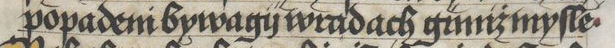popadeni bywagij wradach gimiż myſle.
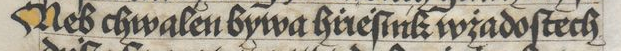Neb chwalen bywa hṙieẛnik wżadoſtech
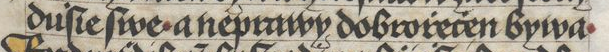duẛie ſwe.a neprawy dobroṙeċen bywa.
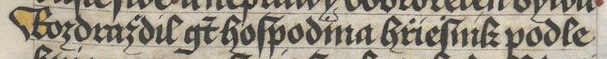Rozdraždil ḡt hoſpodina hṙieẛnik podle
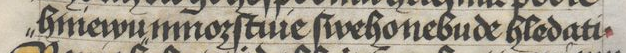hniewu mnozſtvíe ſweho nebude hledati.
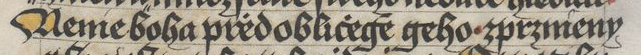Nenie boha pṙed obliċegē geho.zprznieny
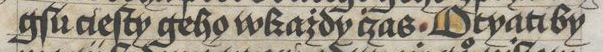gſu cieſty geho w każdy cżas.Otyati by¬
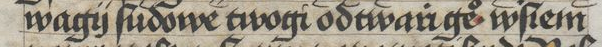wagij ſudowe twogi odtwaṙi geo.wẛiem
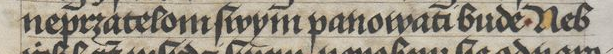neprzatelom ſwym panowati bude.Neb
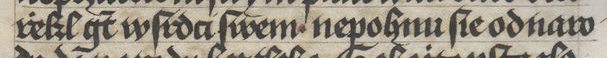ṙekl ḡt wſrdci ſwem.nepohnu ſie od naro¬
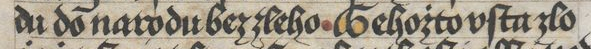du do narodu bez zleho.Gehożto uſta zlo¬
